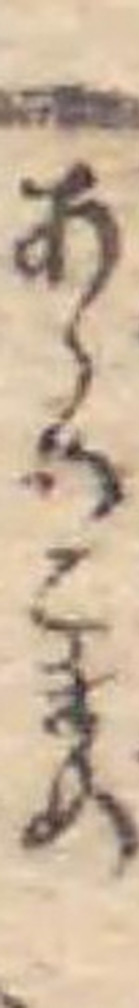あらめこまめ
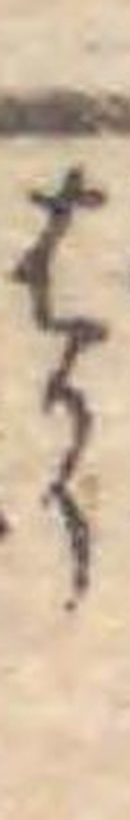はかり
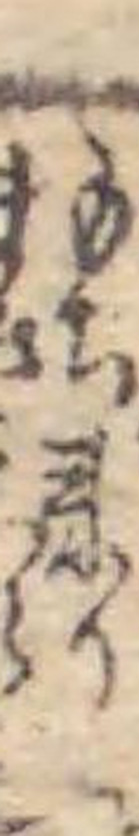もち来り
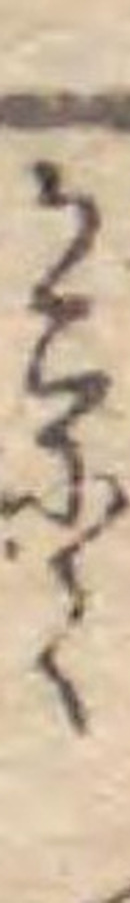かこにて
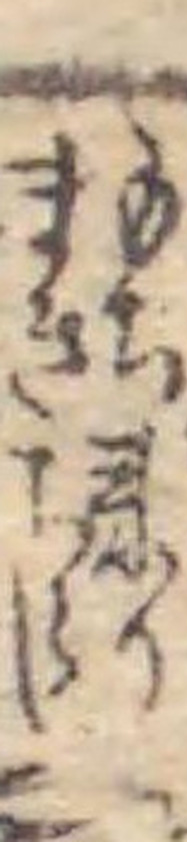まきちらし
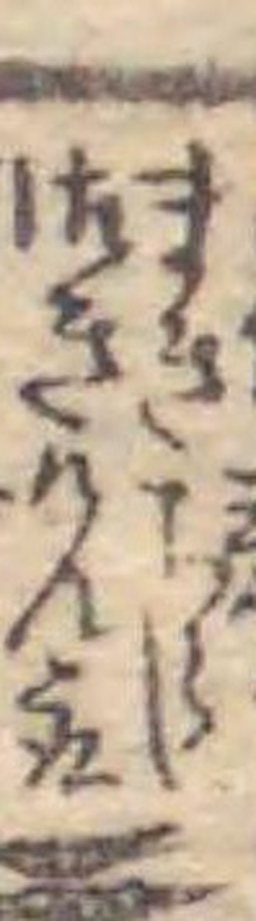御きけん取
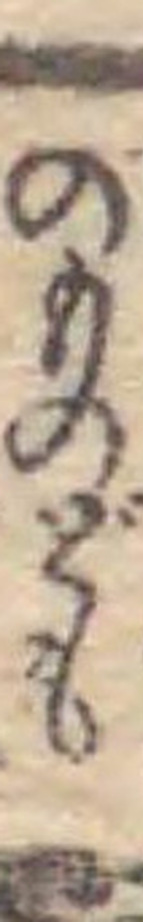のものども
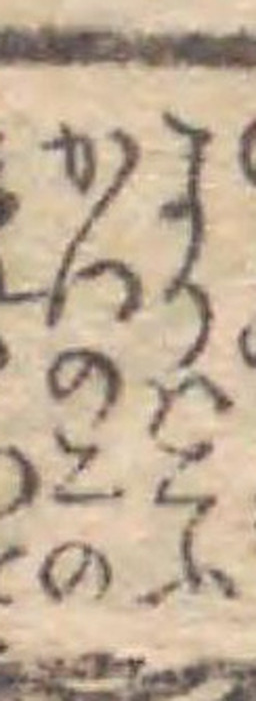かつのこの
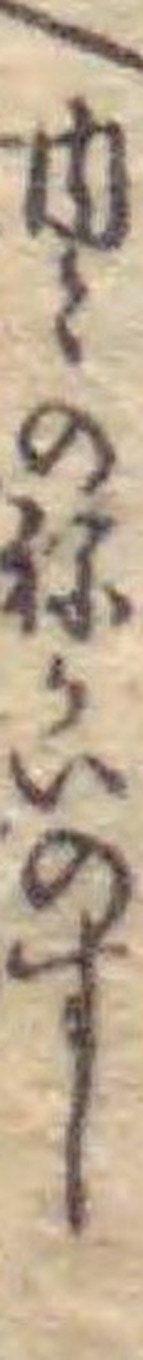内々のねかいのすし
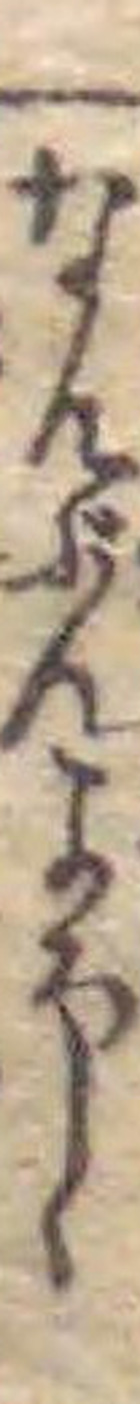なんぶんよろしく
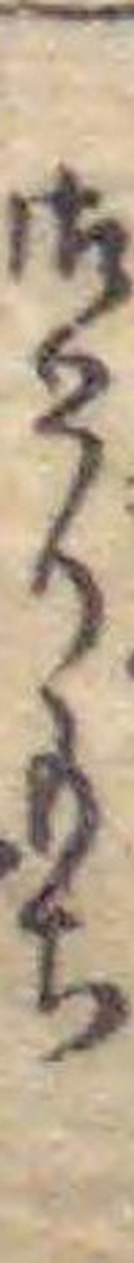御とりもち
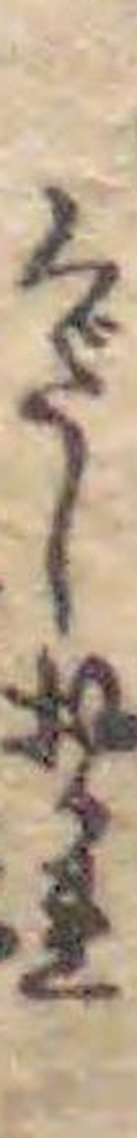くだしおかれ
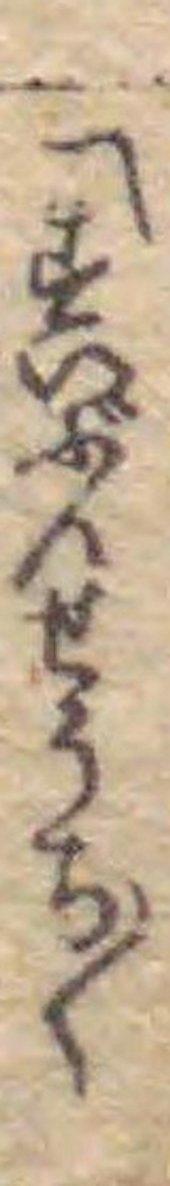〽すいぶんせうち〳〵
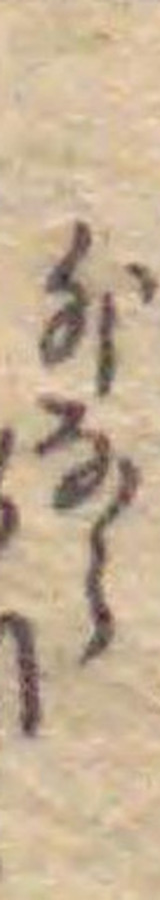外なら
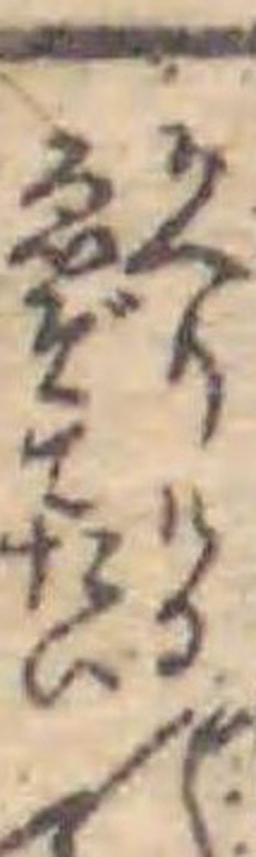ゑぞてたい
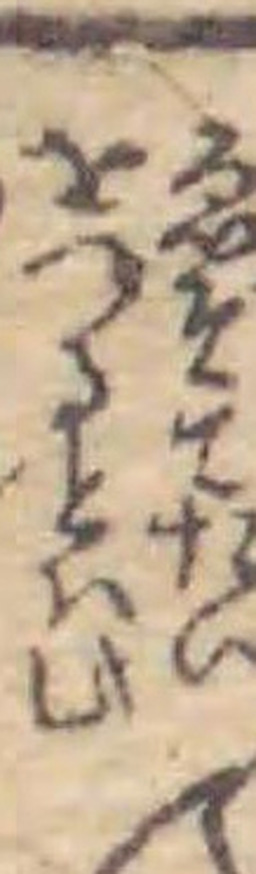をつるとは此
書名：悦贔負蝦夷押領 : 3巻
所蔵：国立国会図書館 National Diet Library, JAPAN
